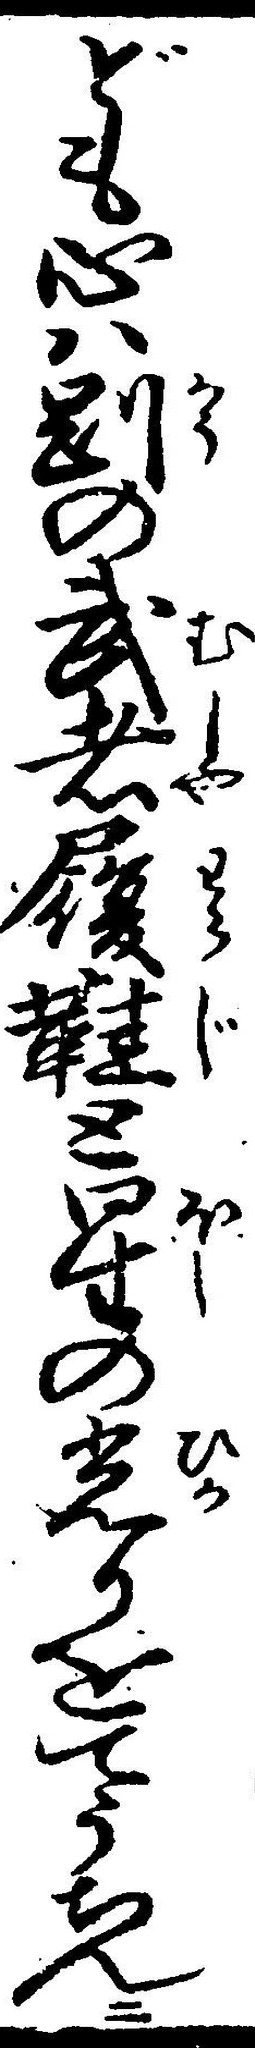ども心は剛の武者履鞋と星の光りをてうちん
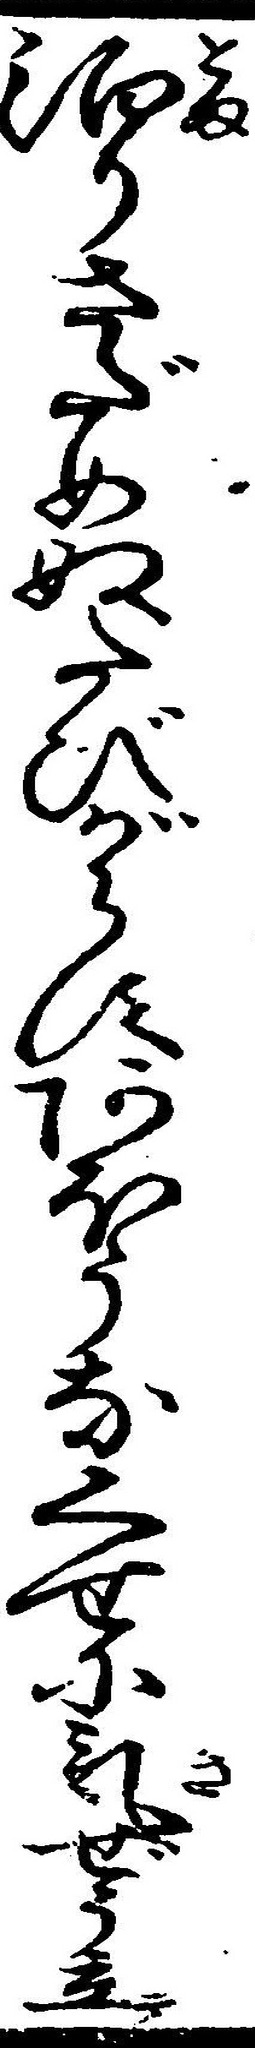泊りさだめぬたびがらすあほうなくせに気ぜう立
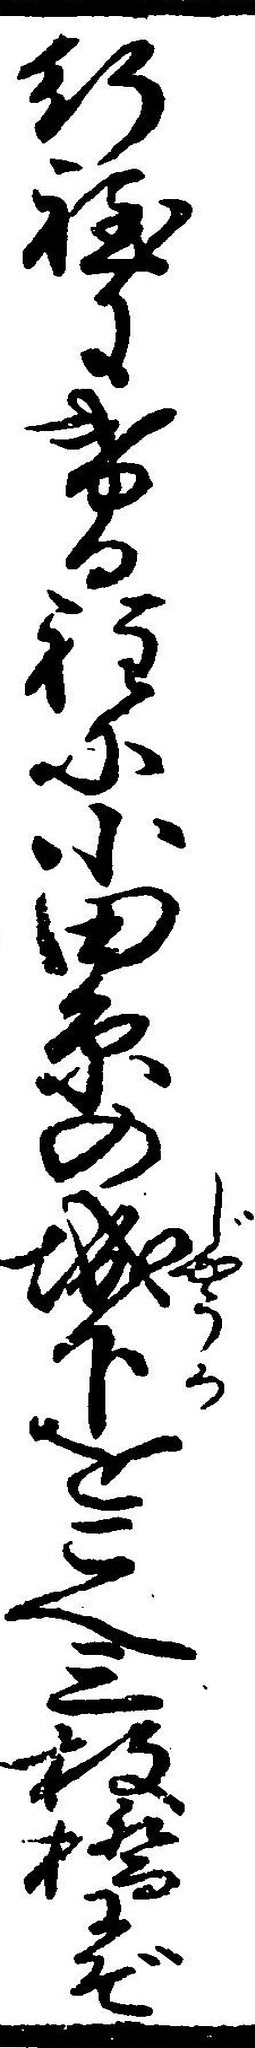行程にける程に小田原の城下をこへ三枝橋にぞ
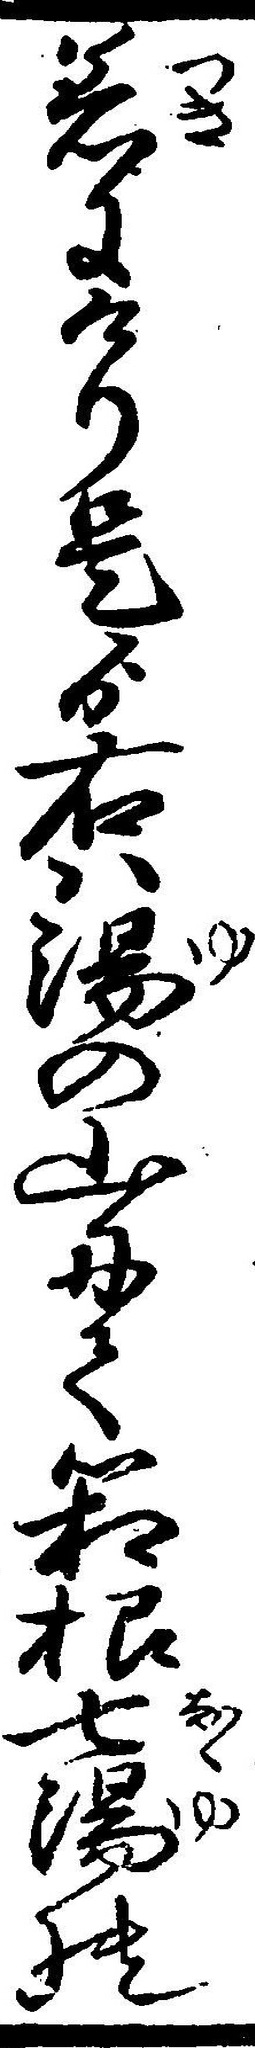着にけり是ゟ右は湯の山にて箱根七湯の
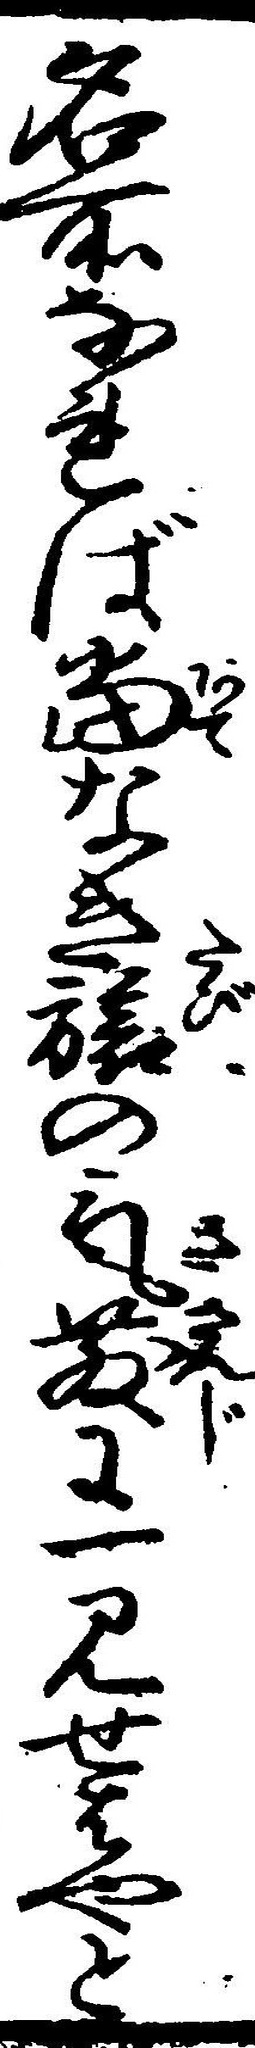名所なれば当なき旅の気散に一見せはやと
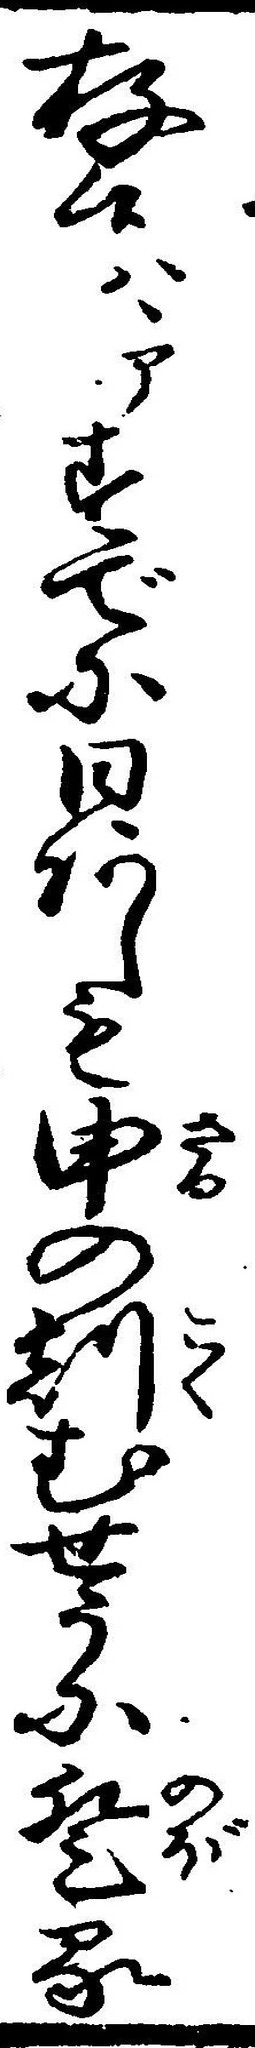存候ヽアすでに日あしも申の刻むせうに登る
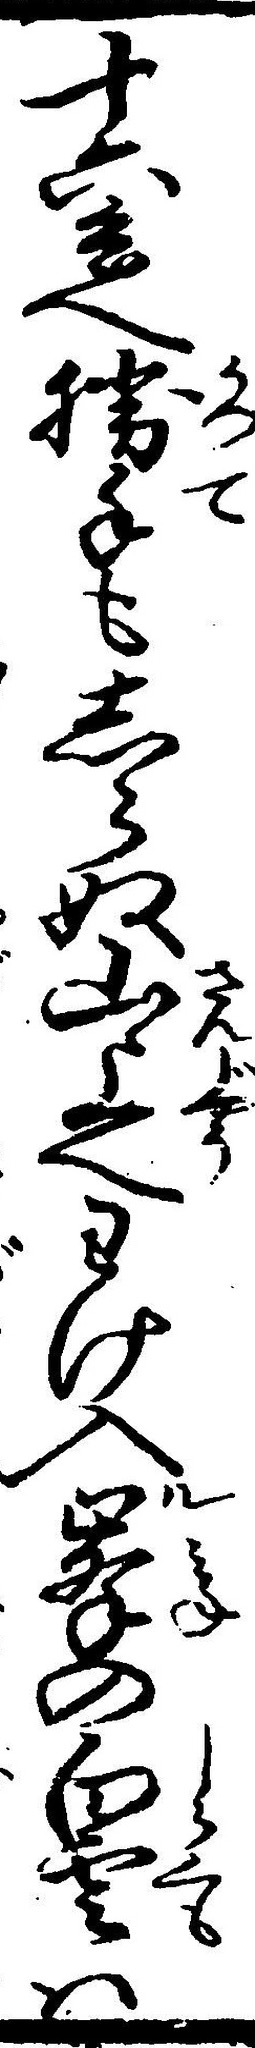十六兵衛勝手もしらぬ山上へわけ入峯の白雲は
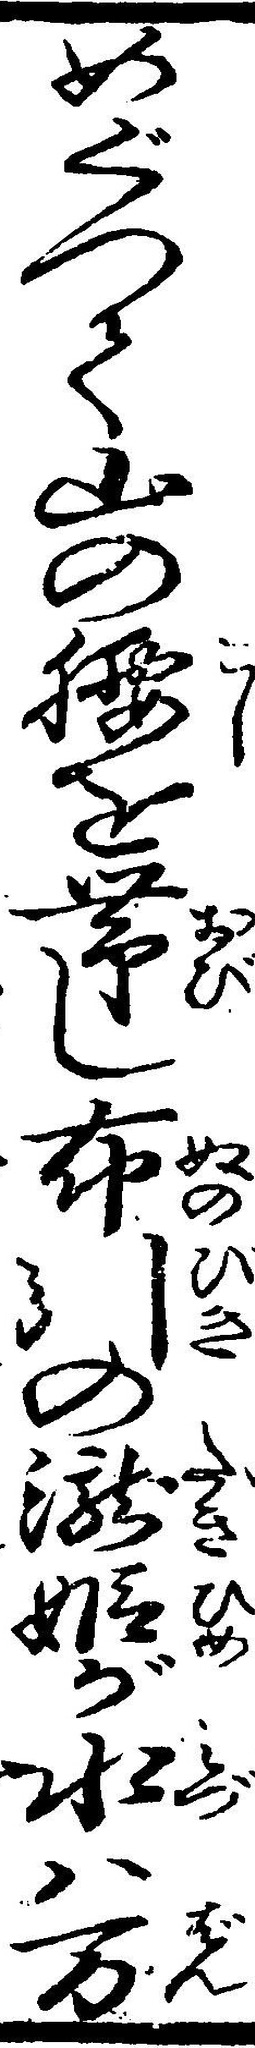めぐつて山の腰を帯し布引きの滝姫が水は万
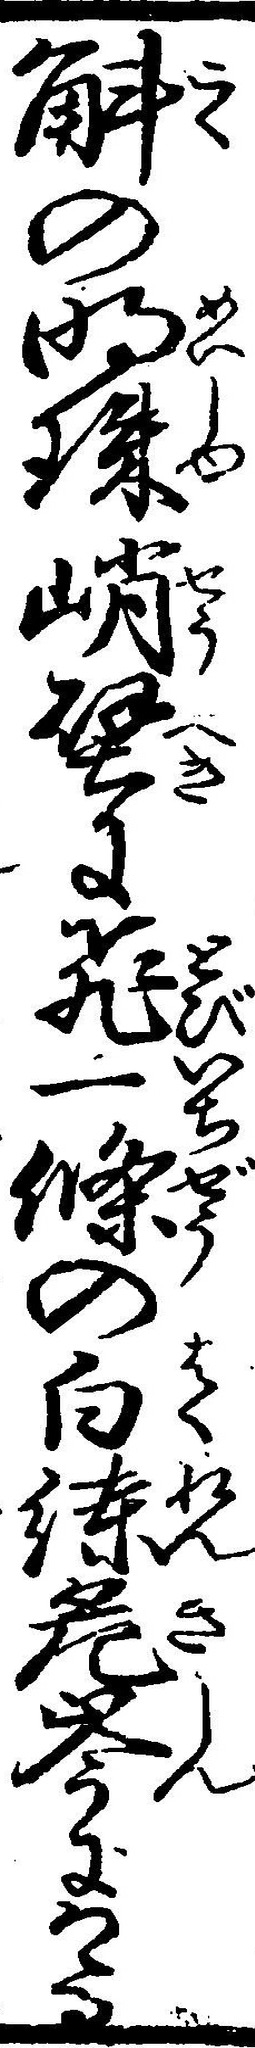斛の明珠峭壁に飛一条の白練危岑にかゝる
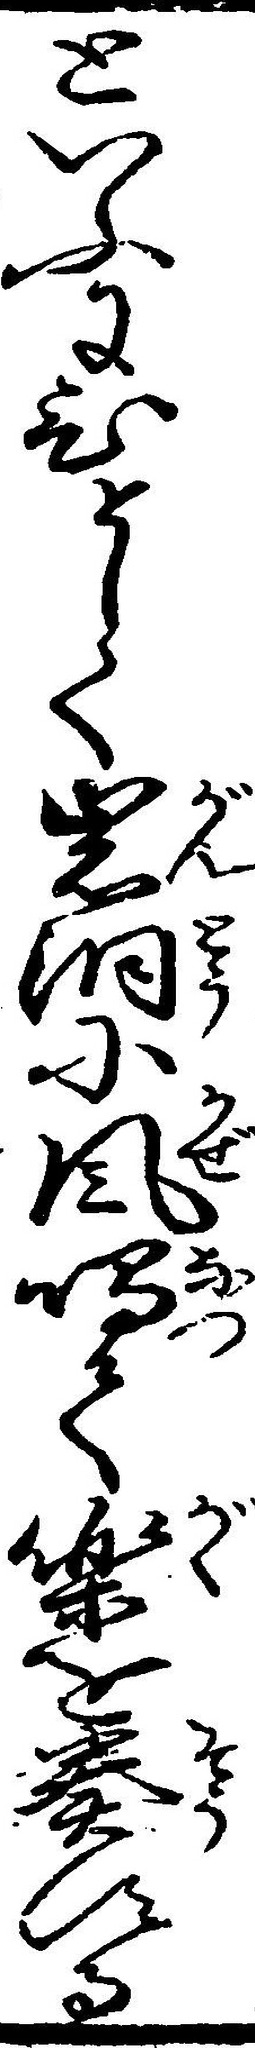といふにひとしく岩洞に風鳴て楽を奏する
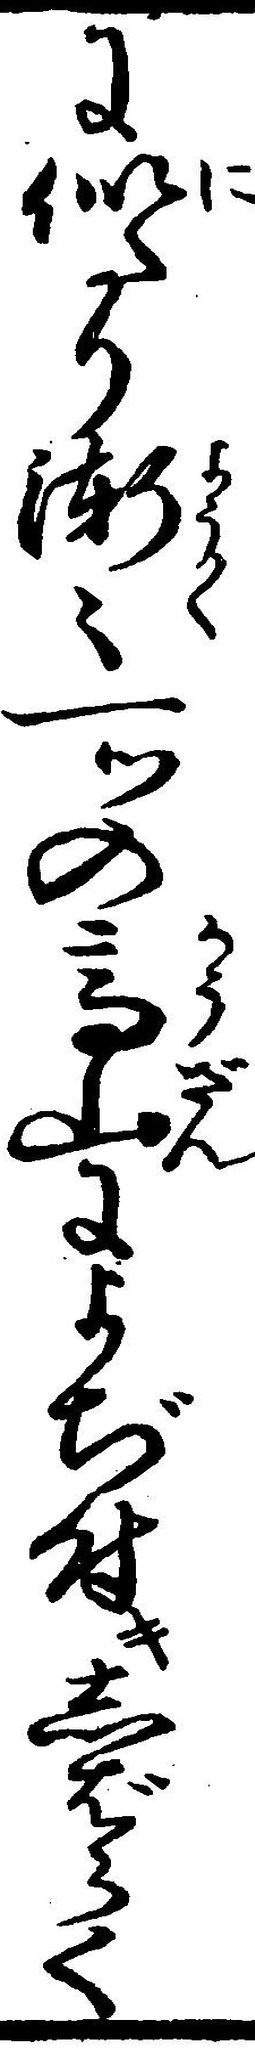に似たり漸々一つの高山によぢ付

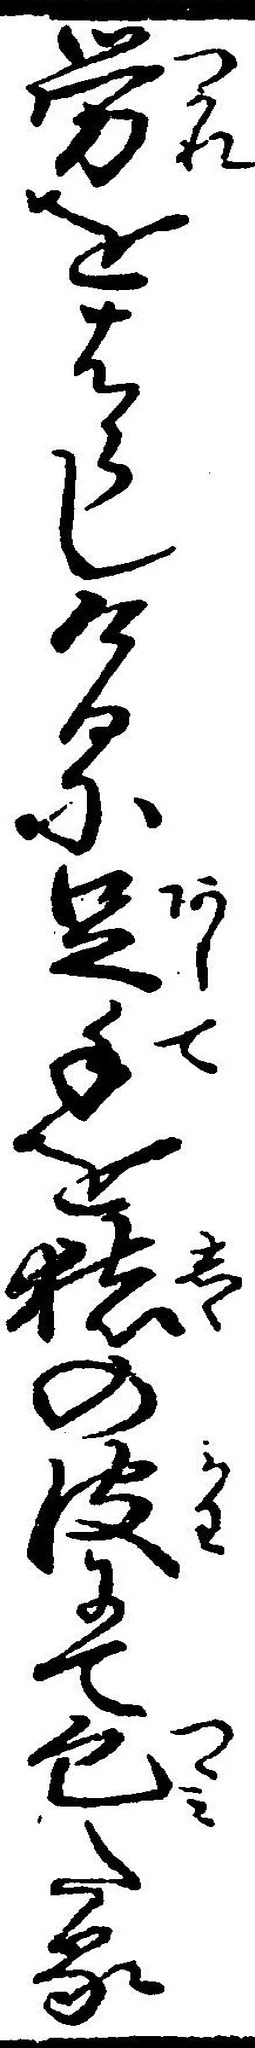労をはらしけるに足手を猪の皮にて包たる
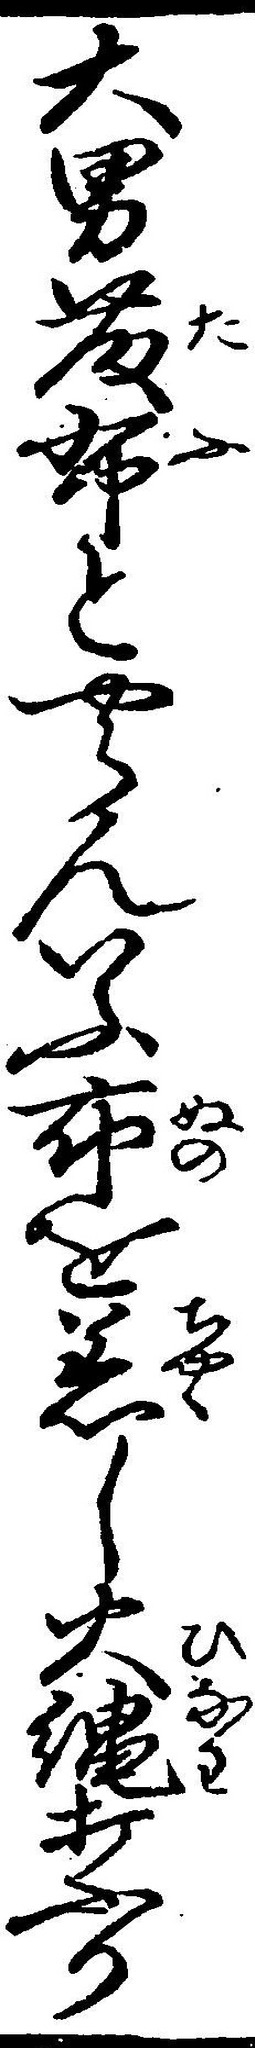大男藤布とやらんいふ布を着して火縄打ふり
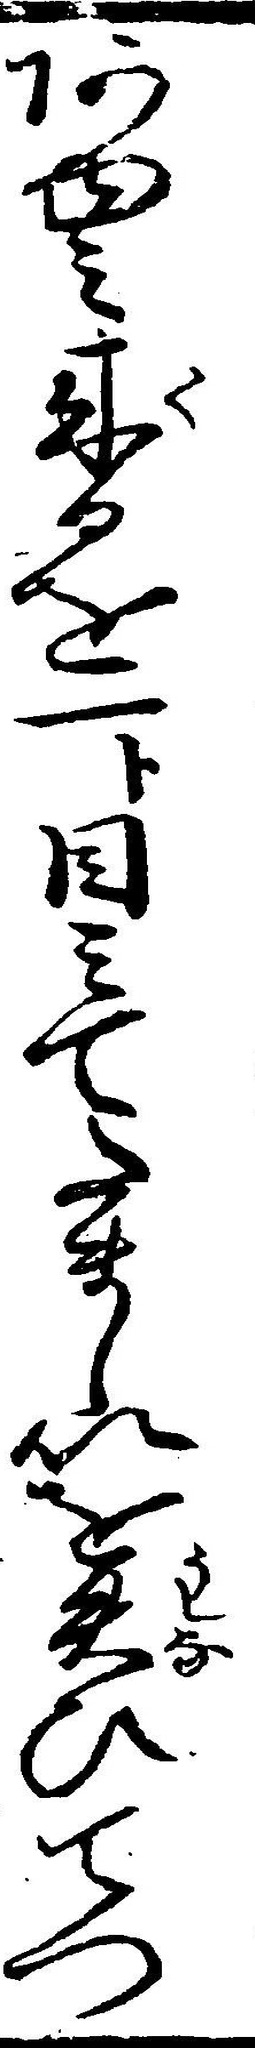あゆみ来るを一目みてたましいを失ひてつ
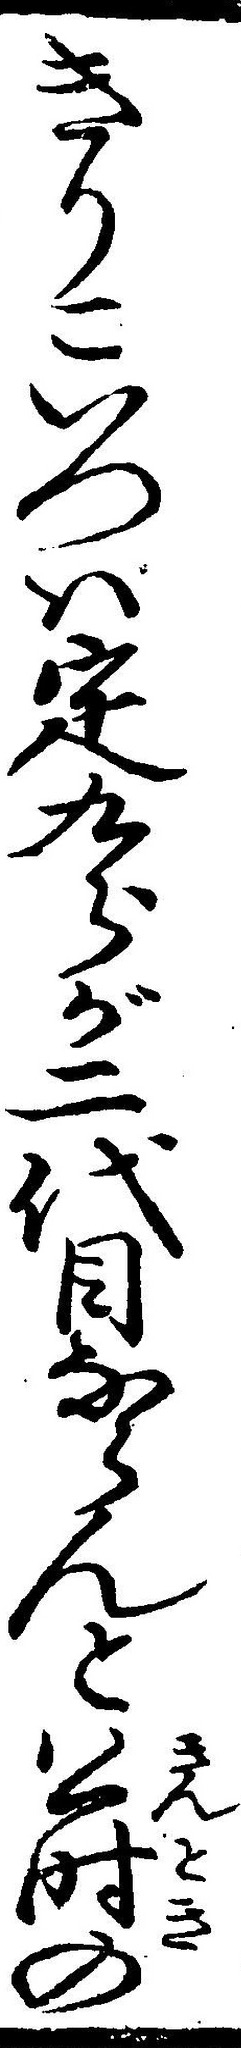きりこいつは定九郎が二代目ならんと公時の
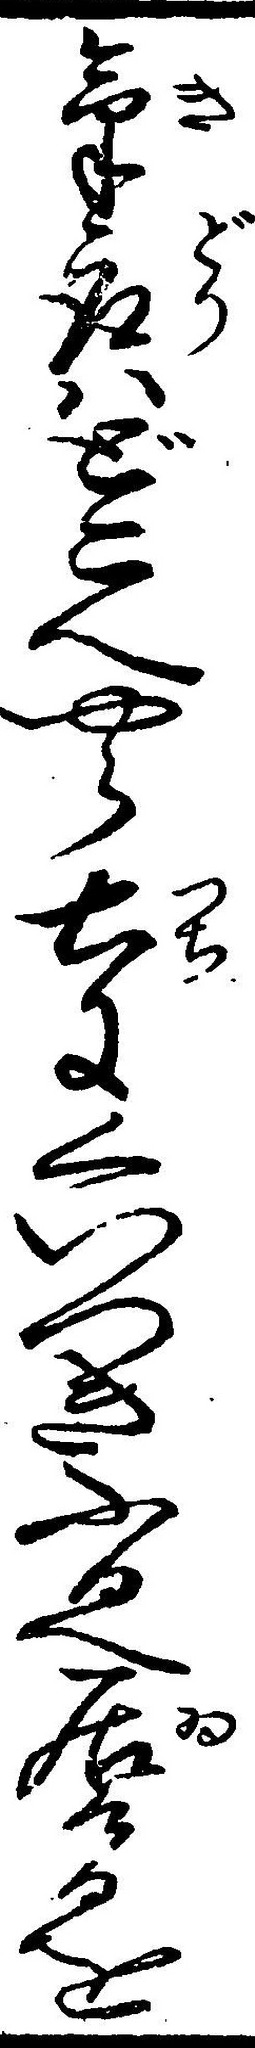気取はどこへやら土にくいつきふるへ居けるを
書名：草木芝居化物退治 / 泉花堂三蝶(十六兵衛)作
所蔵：東京大学総合図書館 General Library in the University of Tokyo, JAPAN
